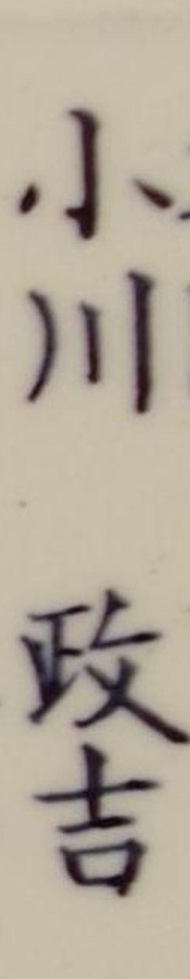小川政吉
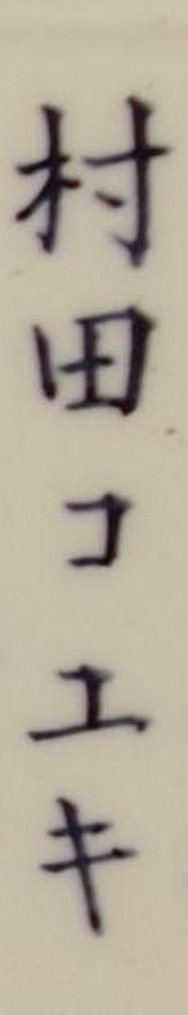村田コユキ
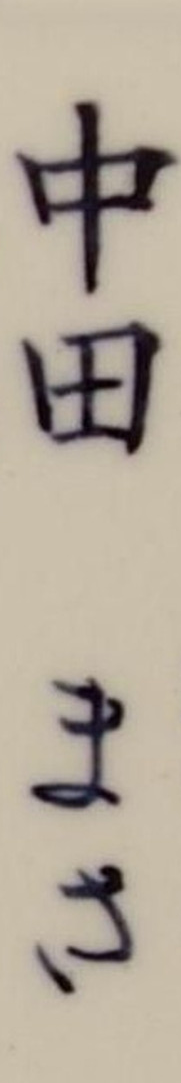中田まさ
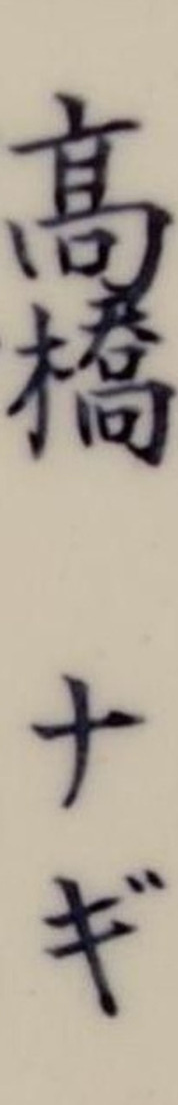高橋ナギ
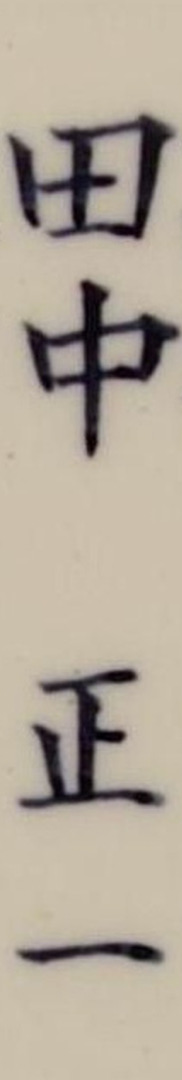田中正一
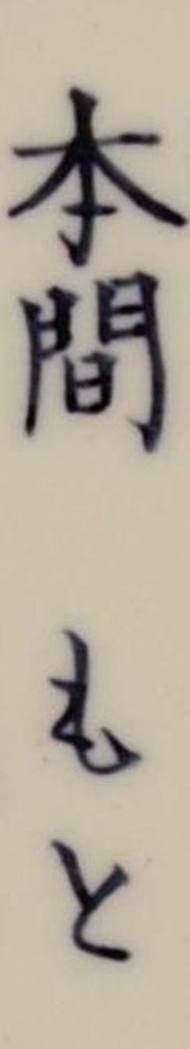本間もと
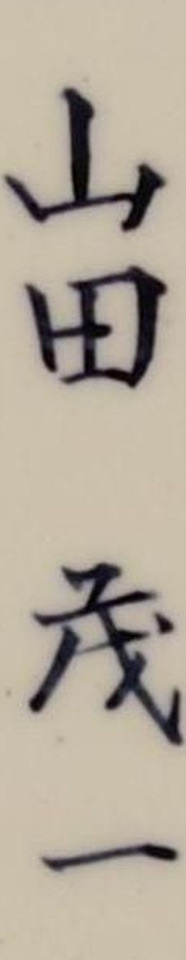山田茂一
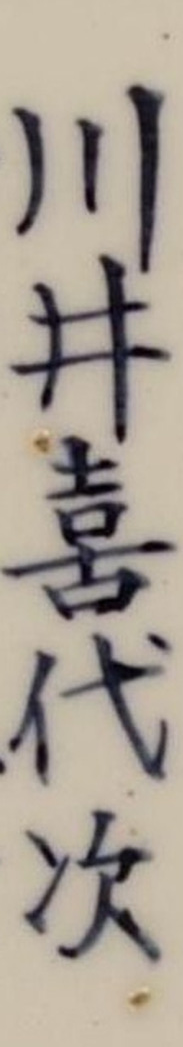川井喜代次
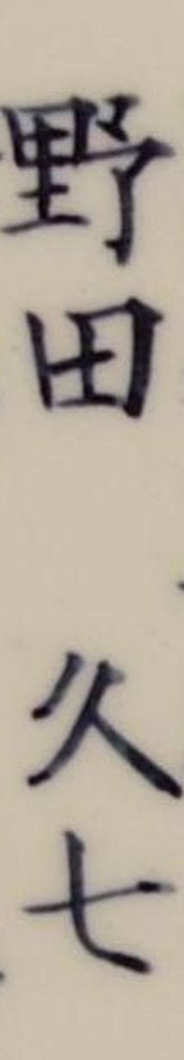野田久七
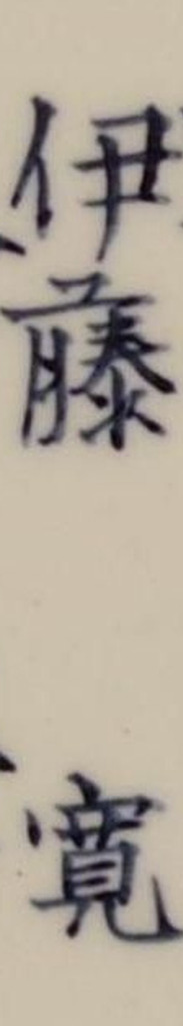伊藤寛
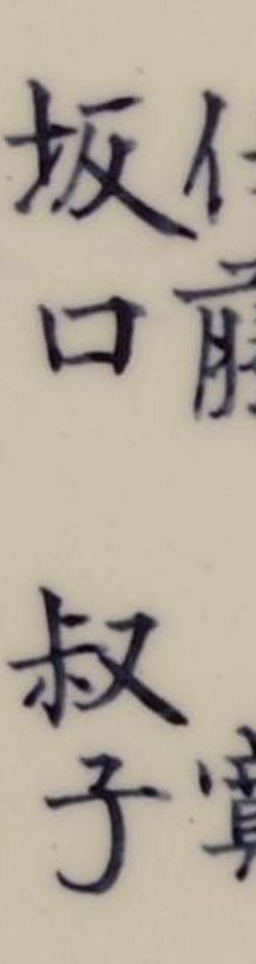坂口叔子
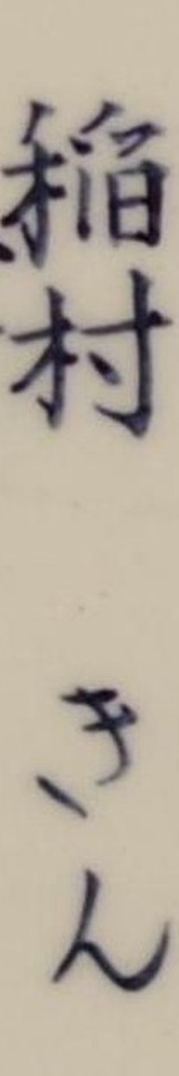稲村きん
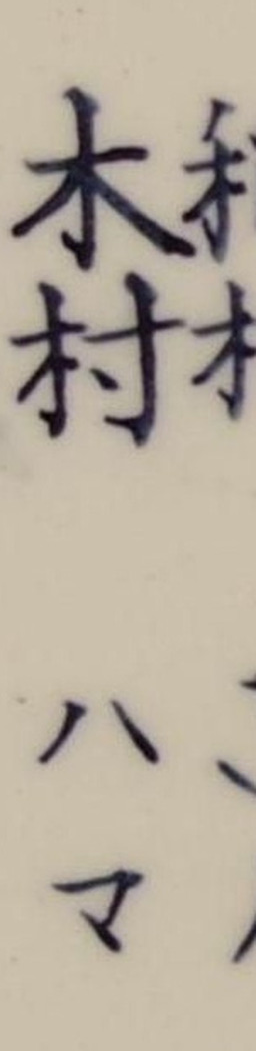木村ハマ
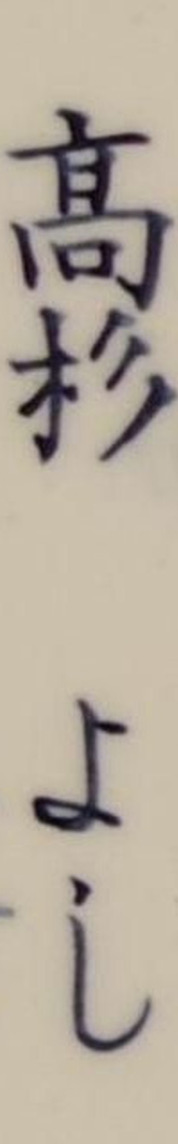高杉よし
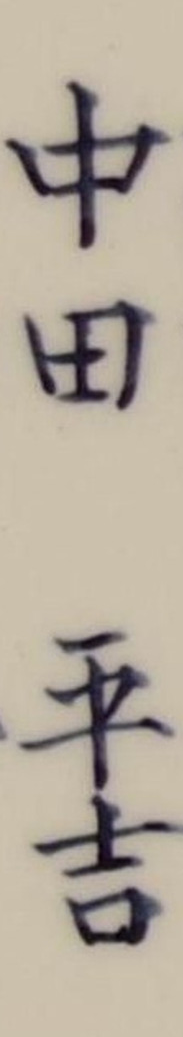中田平吉
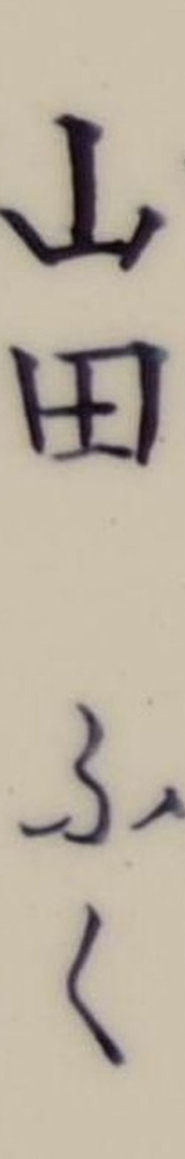山田ふく
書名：E~L
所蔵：高野山金剛峯寺
